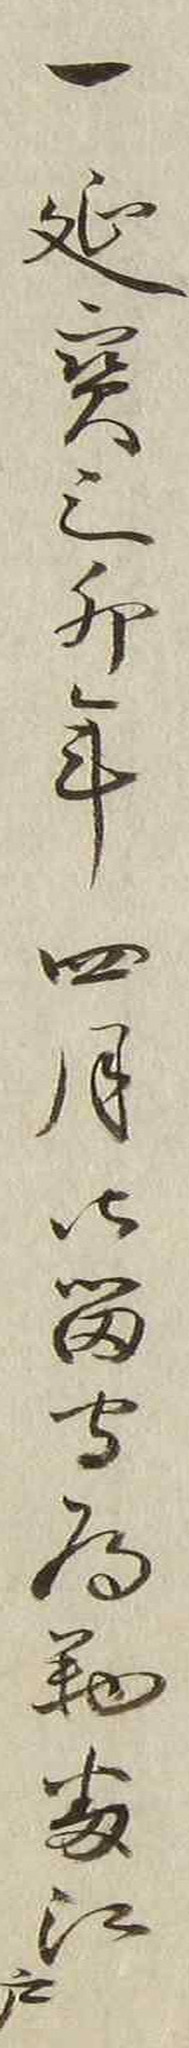一延宝三卯年四月御留守為勤番江戸
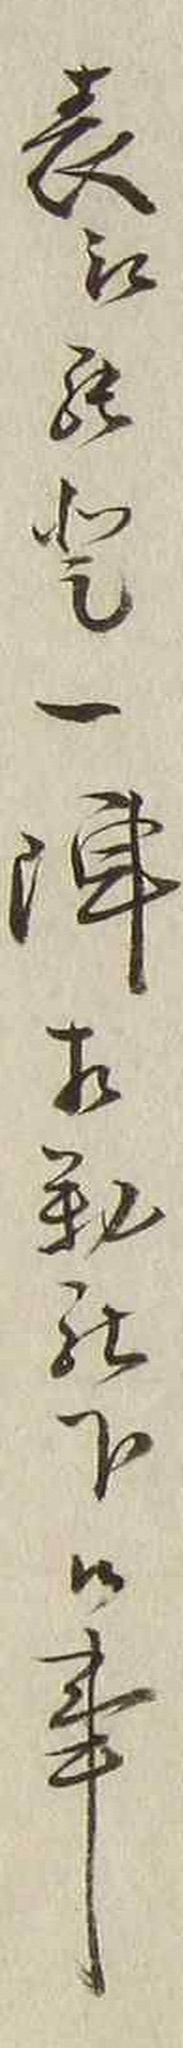表え罷登一陣相勤罷下候事

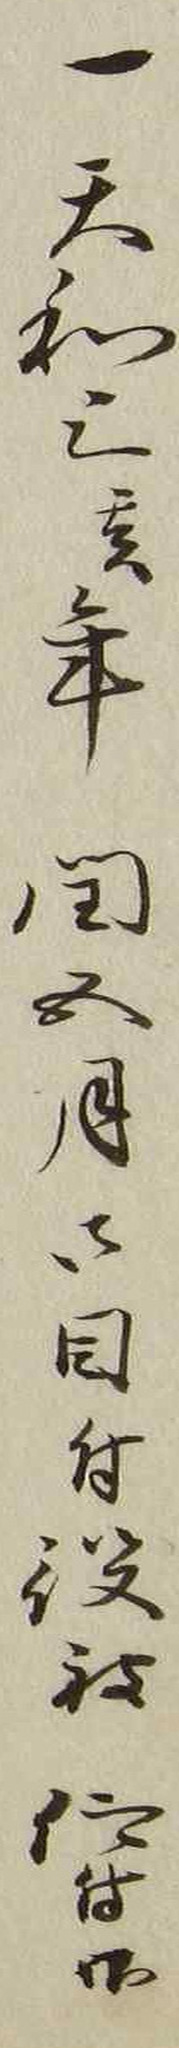一天和三亥年閏五月御目付役被仰付候
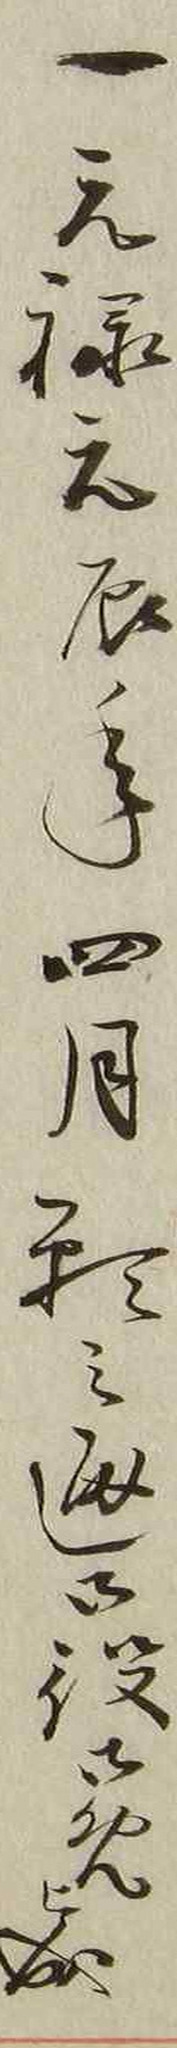一元禄元辰年四月願之通御役御免被成
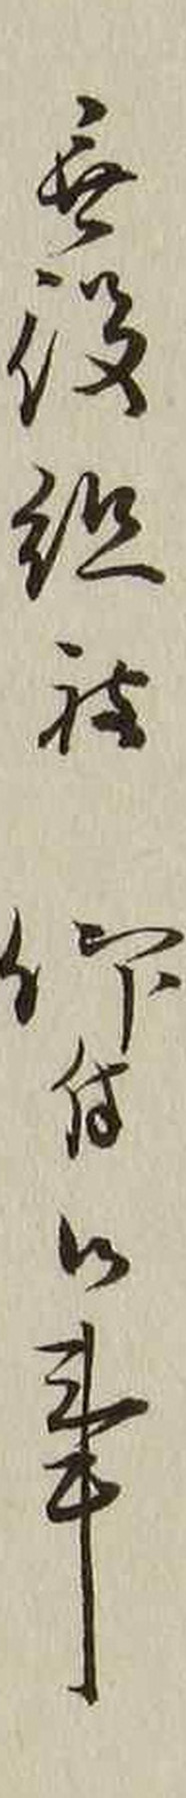無役組被仰付候事
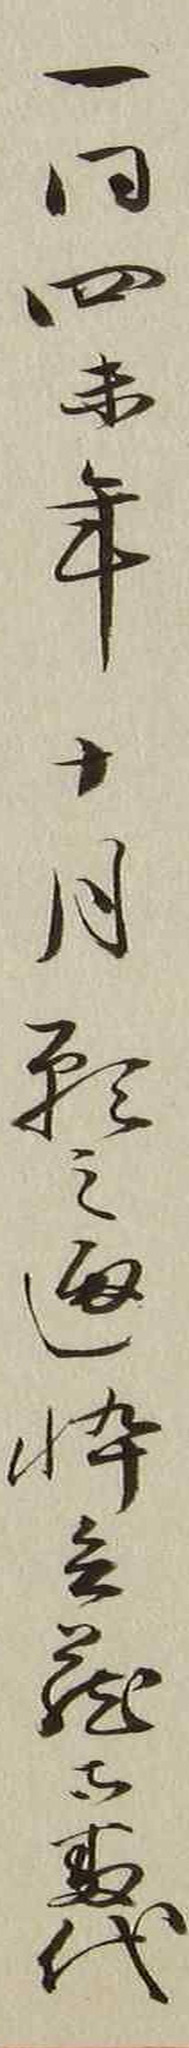一同四未年十月願之通悴兵蔵御番代
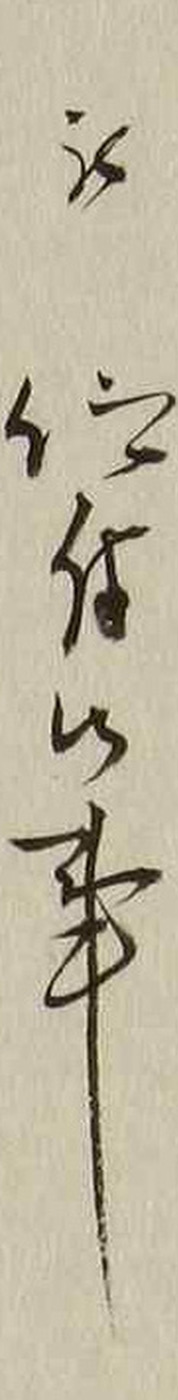被仰付候事
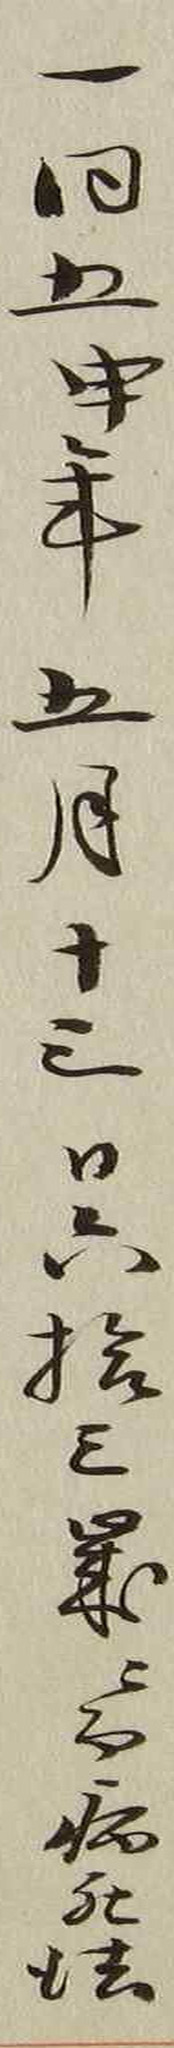一同五申年五月十三日六拾三歳に而病死法
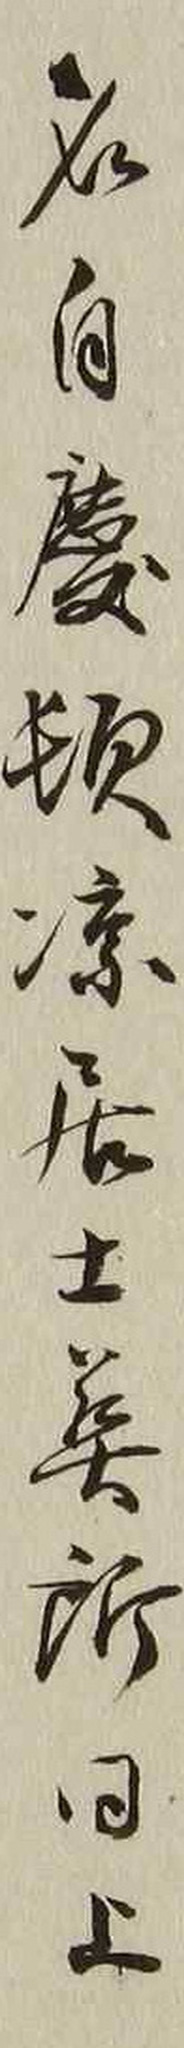名自慶頓涼居士葬所同上
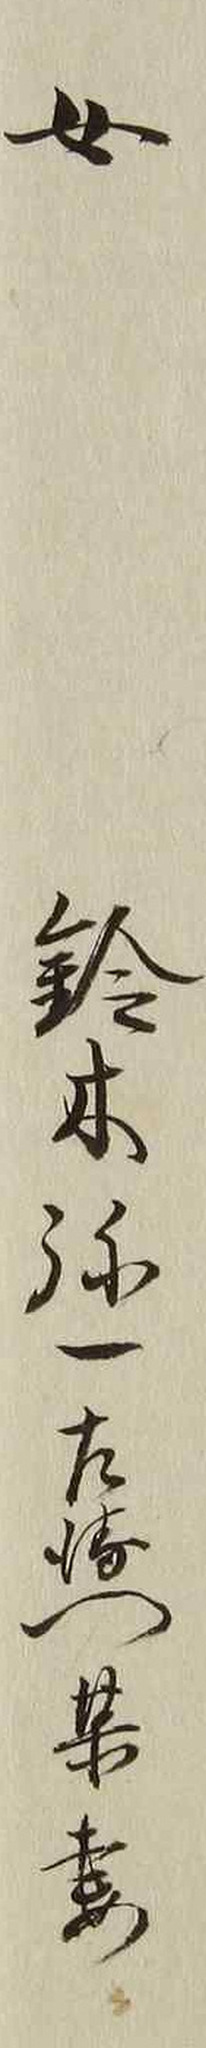女鈴木弥一左衛門某妻
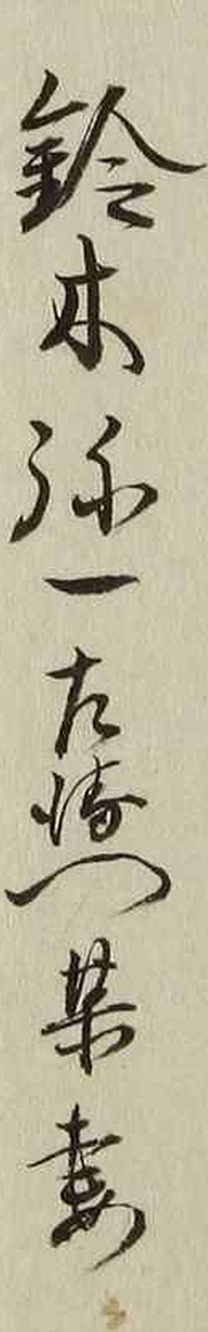女鈴木弥一左衛門某妻
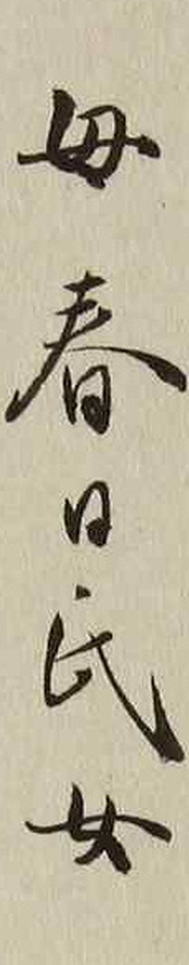母春日氏女
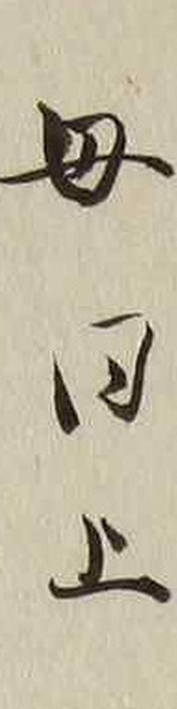母同上
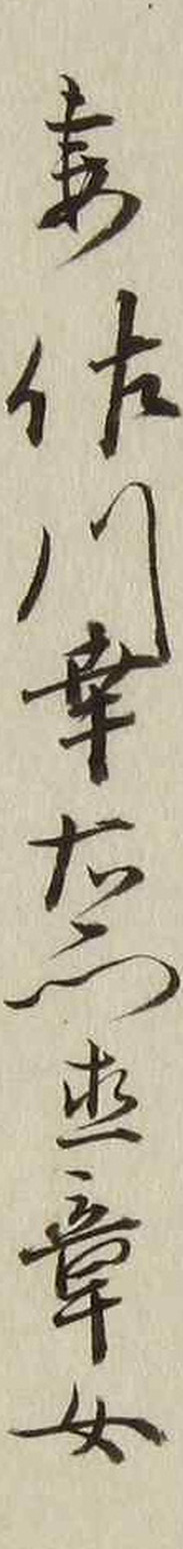妻佐川幸右衛門直章女
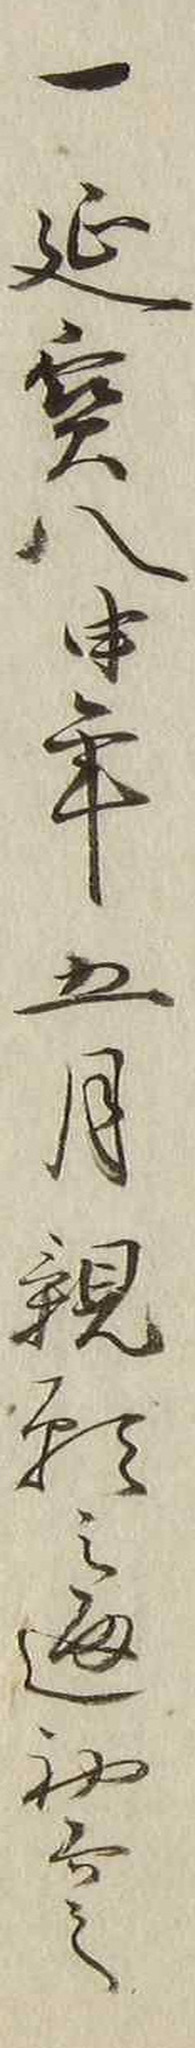一延宝八申年五月親願之通初而之
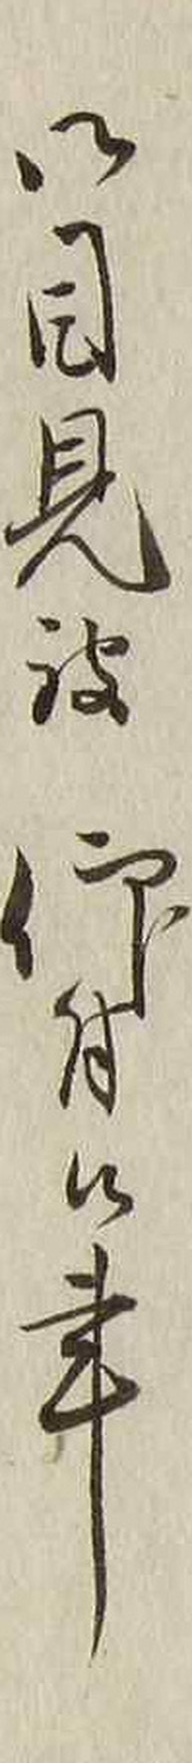御目見被仰付候事
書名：諸士系譜　巻之157　ね之部1
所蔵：会津若松市立会津図書館
